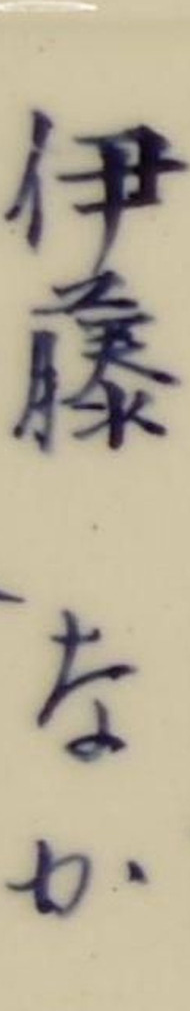伊藤なか
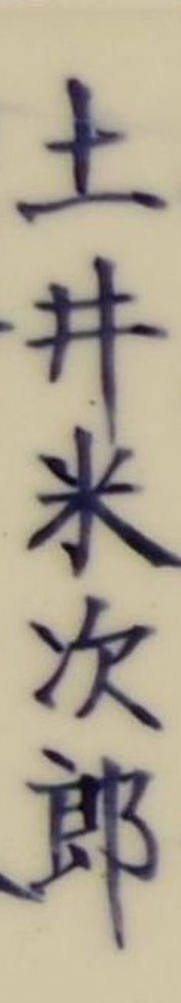土井米次郎
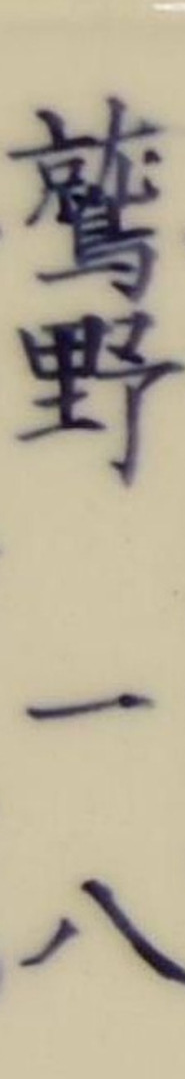鷲野一八
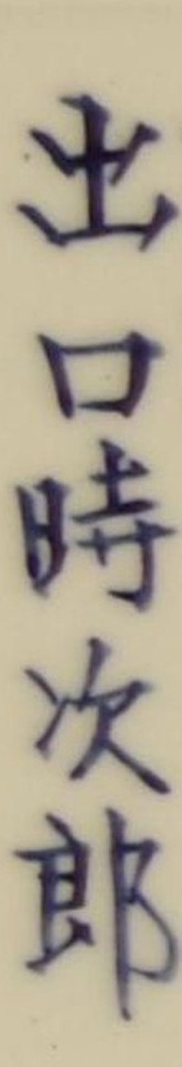出口時次郎

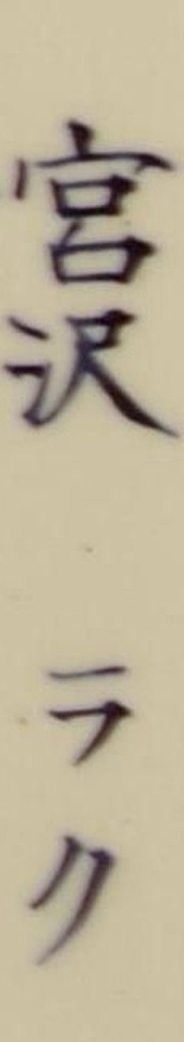宮沢ラク
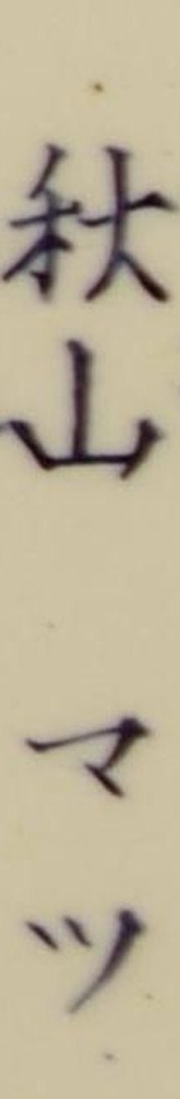秋山マツ
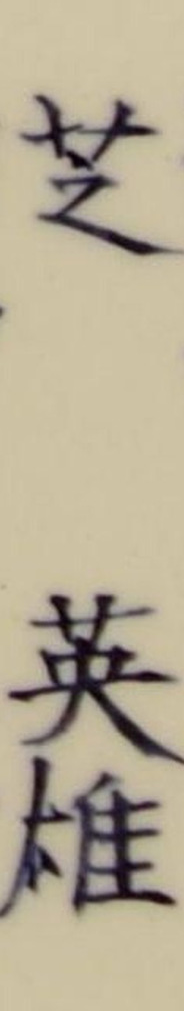芝英雄
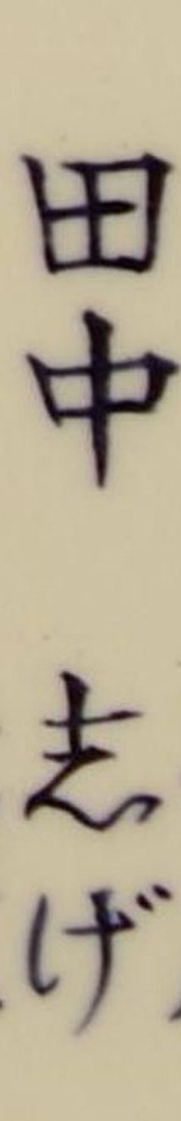田中志げ
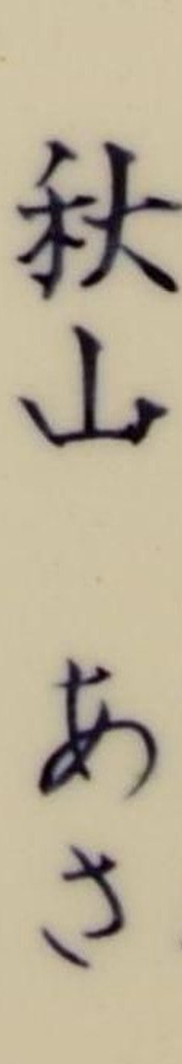秋山あさ
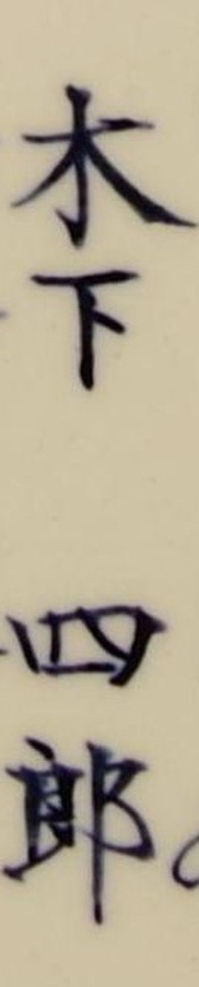木下四郎
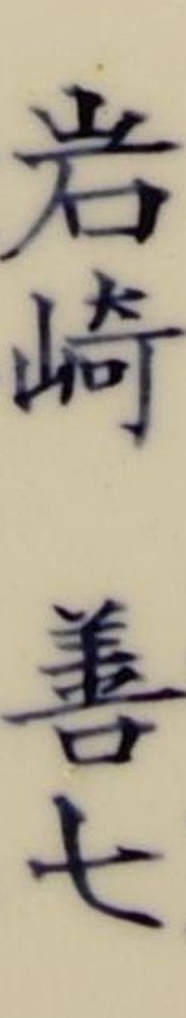岩崎善七
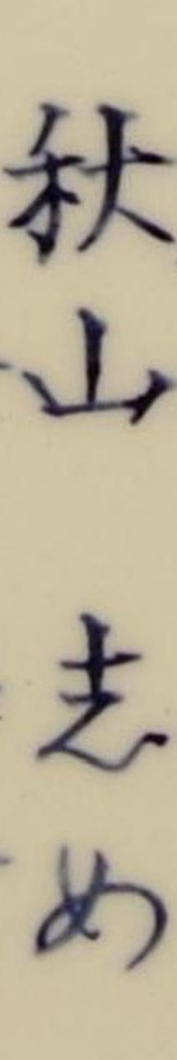秋山志め
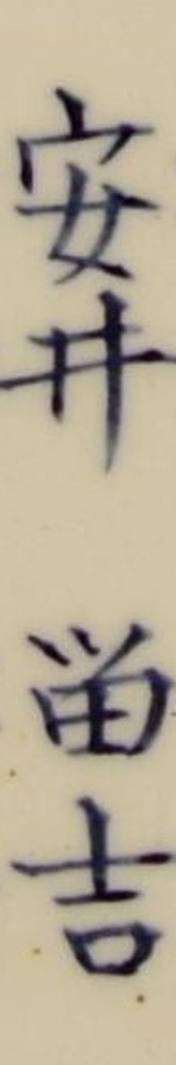安井留吉
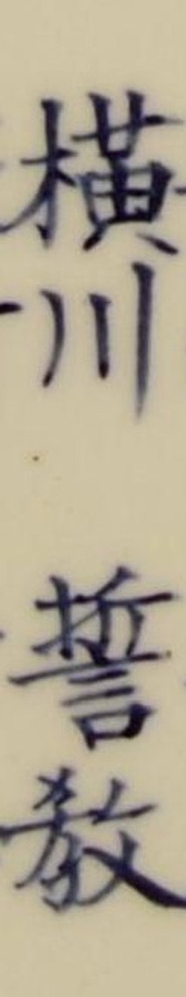横川誓教
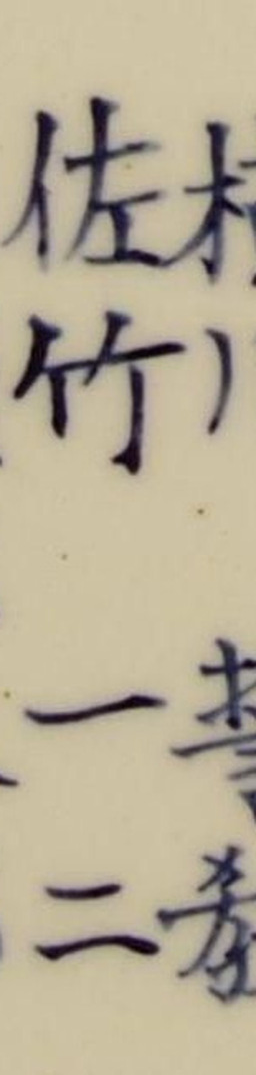佐竹一二
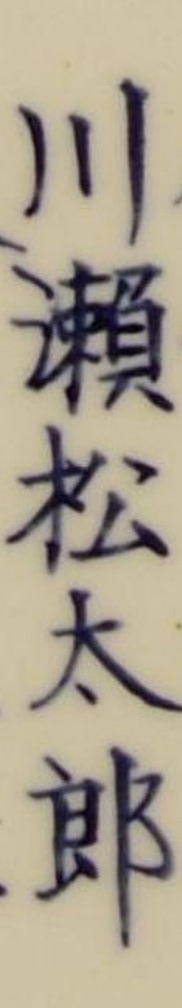川瀬松太郎
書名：E~L
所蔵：高野山金剛峯寺
